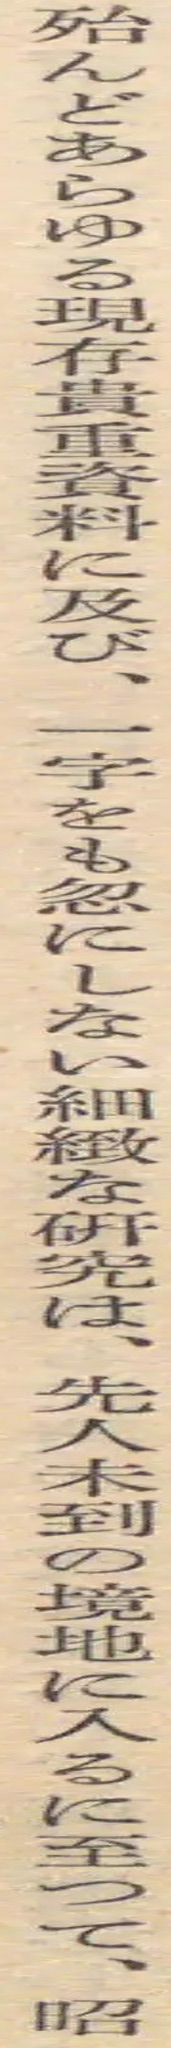殆んどあらゆる現存貴重資料に及び、一字をも忽にしない細緻な硏究は、先人未到の境地に入るに至つて、昭
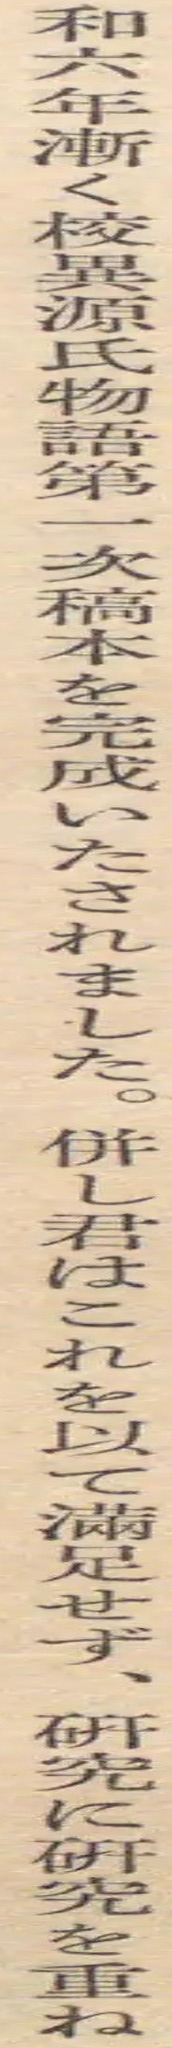和六年漸く校異源氏物語第一次稿本を完成いたされました。併し君はこれを以て滿足せず、硏究に硏究を重ね
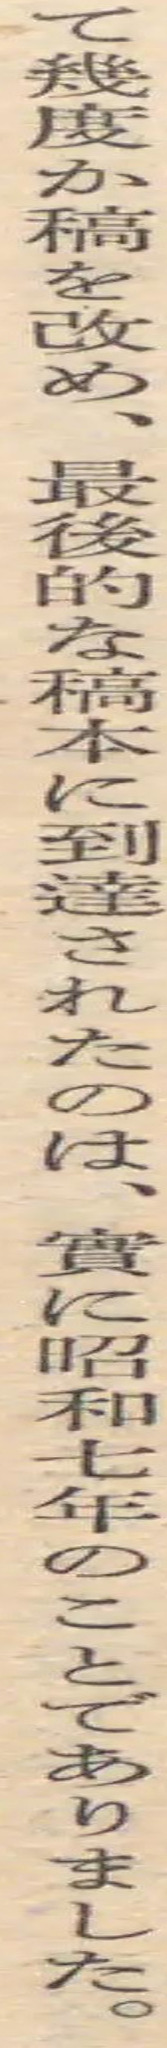て幾度か稿を改め、最後的な稿本に到達されたのは、實に昭和七年のことでありました。
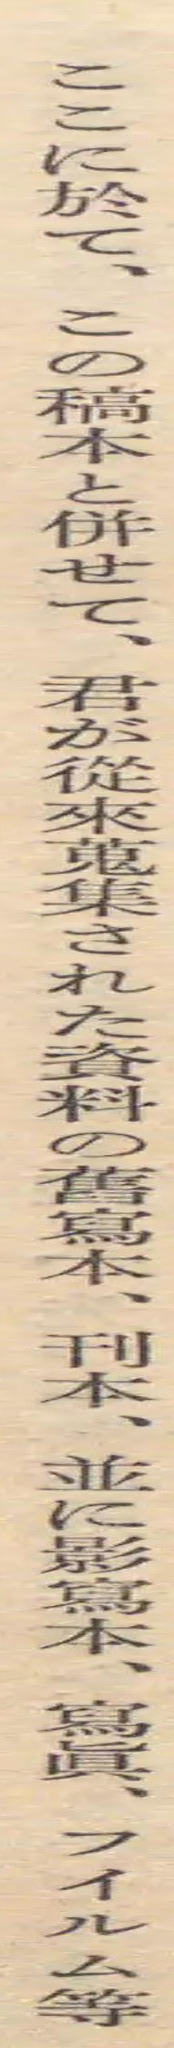ここに於て、この稿本と併せて、君が從來蒐集された資料の舊寫本、刊本、並に影寫本、寫眞、フイルム等
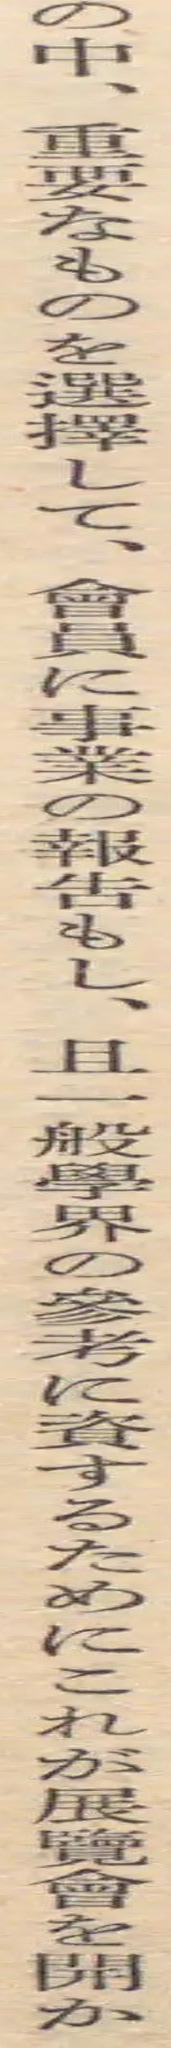の中、重要なものを選擇して、會員に事業の報告もし、且一般學界の參考に資するためにこれが展覽會を開か
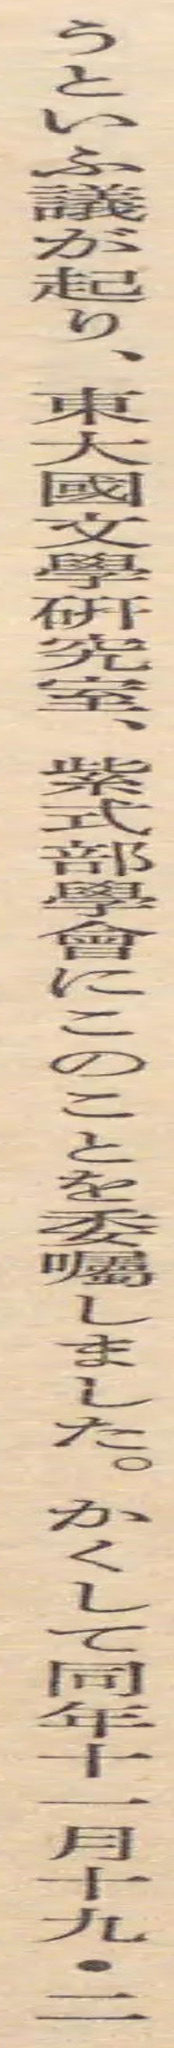うといふ議が起り、東大國文學硏究室、紫式部學會にこのことを委囑しました。かくして同年十一月十九・二
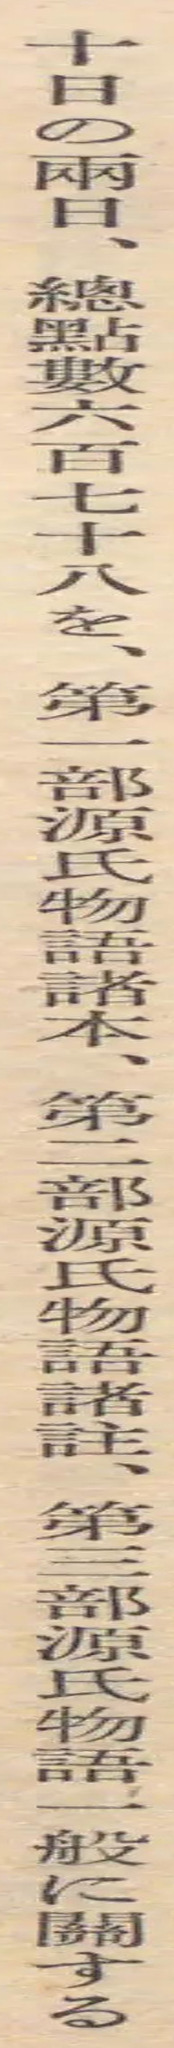十日の兩日、總點數六百七十八を、第一部源氏物語諸本、第二部源氏物語諸註、第三部源氏物語一般に關する
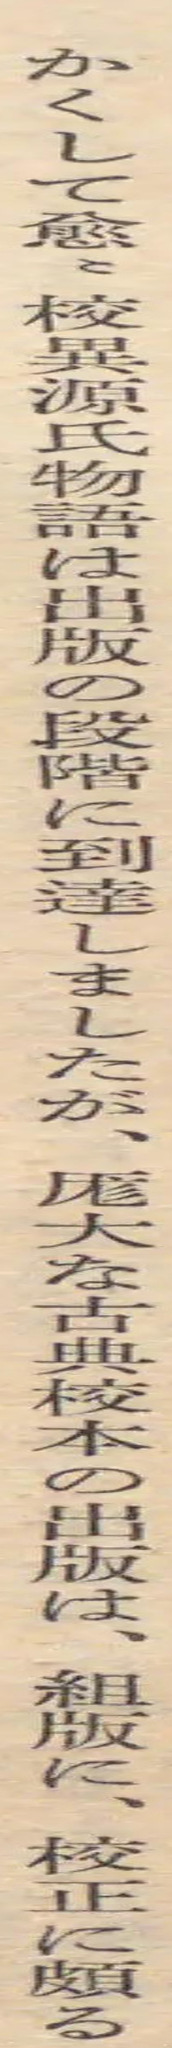かくして愈〻校異源氏物語は出版の段階に到達しましたが、厖大な古典校本の出版は、組版に、校正に頗る
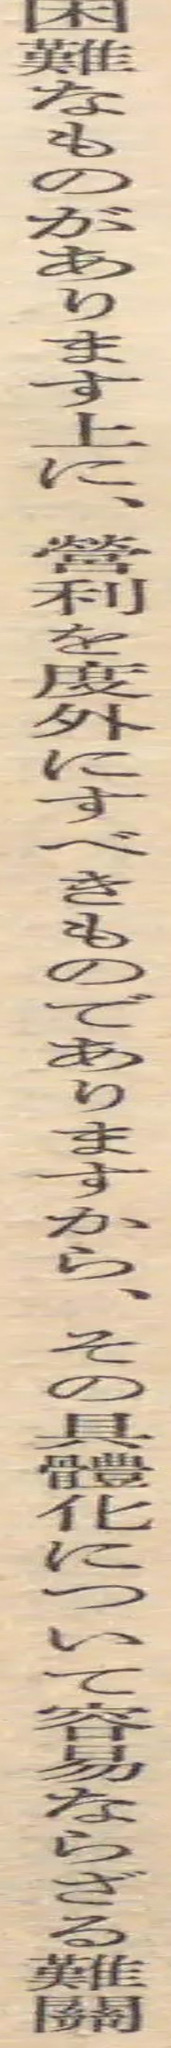困難なものがあります上に、營利を度外にすべきものがありますから、その具體化について容易ならざる難關
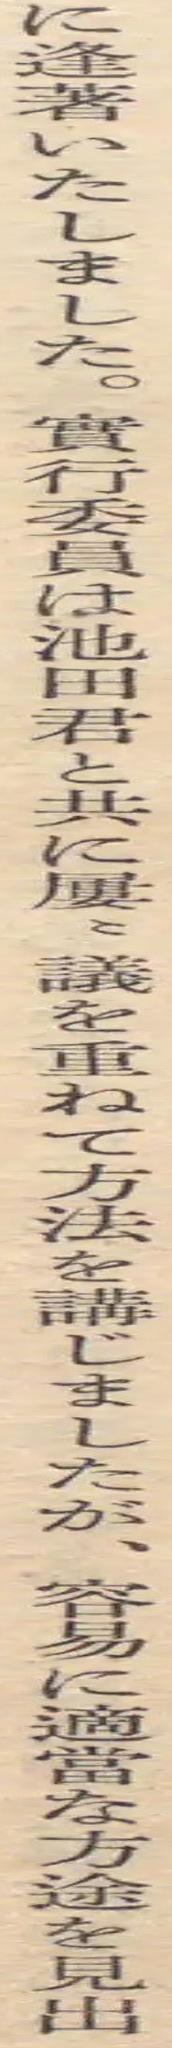に逢著いたしました。實行委員は池田君と共に屢〻議を重ねて方法を講じましたが、容易に適當な方途を見出
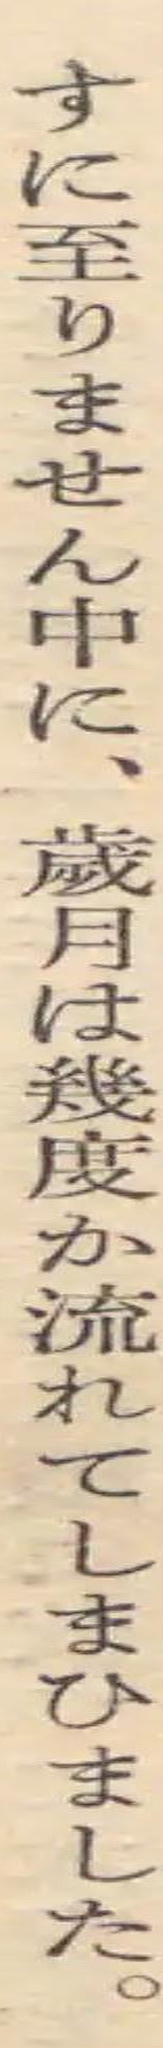すに至りません中に、歲月は幾度か流れてしまひました。
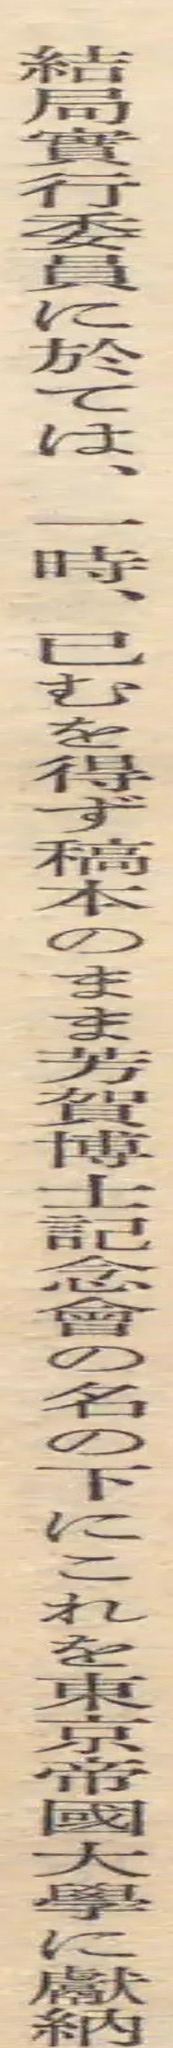結局實行委員に於ては、一時、已むを得ず稿本のまま芳賀博士記念會の名の下にこれを東京帝國大學に獻納
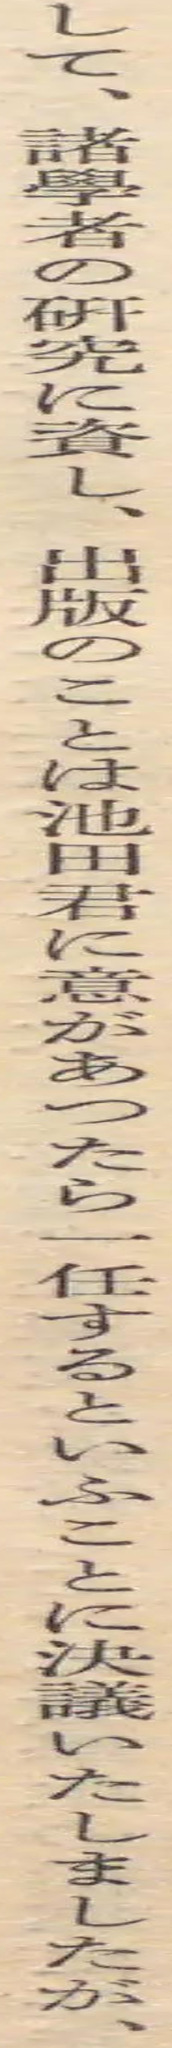して、諸學者の硏究に資し、出版のことは池田君に意があつたら一任するといふことに決議いたしましたが、
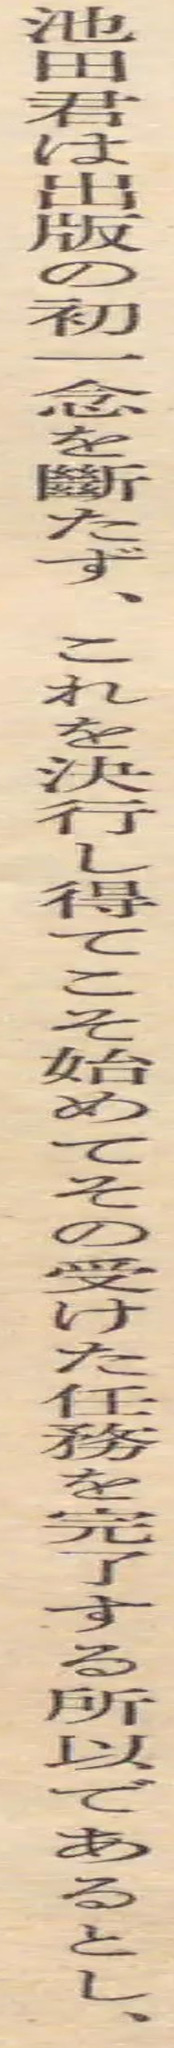池田君は出版の初一念を斷たず、これを決行し得てこそ始めてその受けた任務を完了する所以であるとし、
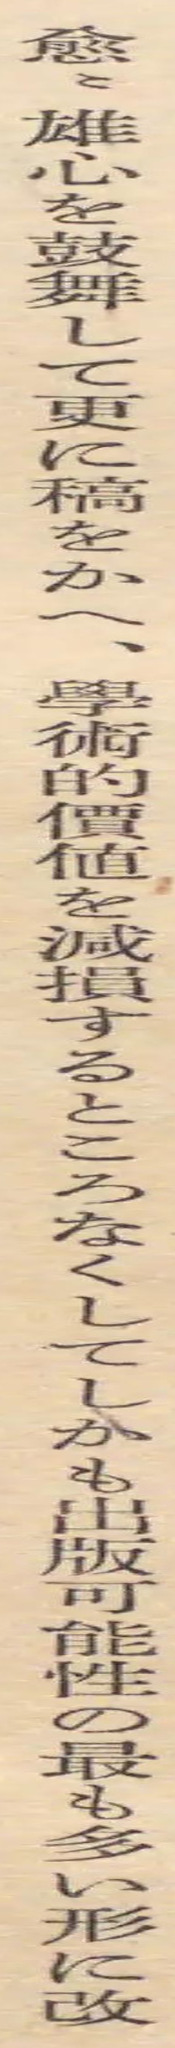愈〻雄心を鼓舞して更に稿をかへ、學術的價値を減損するところなくしてしかも出版可能性の最も多い形に改
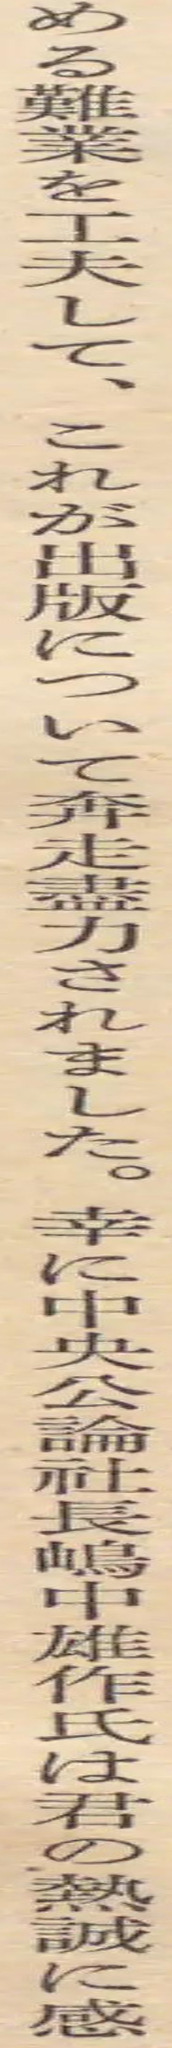める難業を工夫して、これが出版について奔走盡力されました。幸に中央公論社長嶋中雄作氏は君の熱誠に感
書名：校異源氏物語.
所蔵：国立国会図書館 National Diet Library, JAPAN
